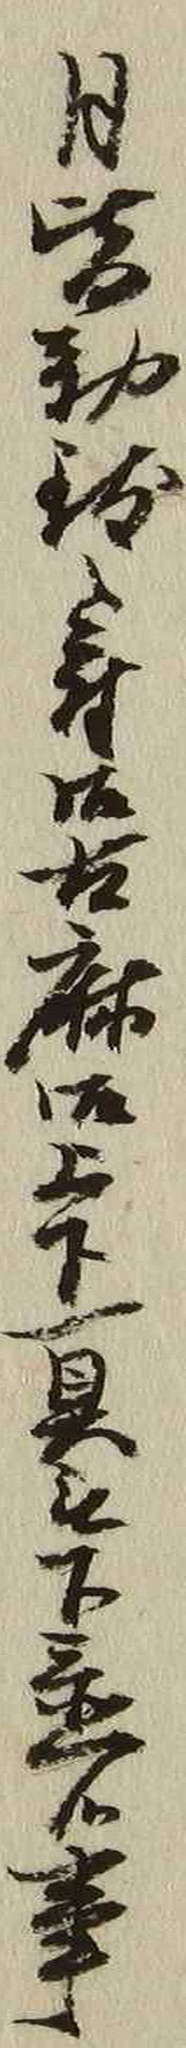月皆勤致候ニ付御古麻御上下一具被下置候事
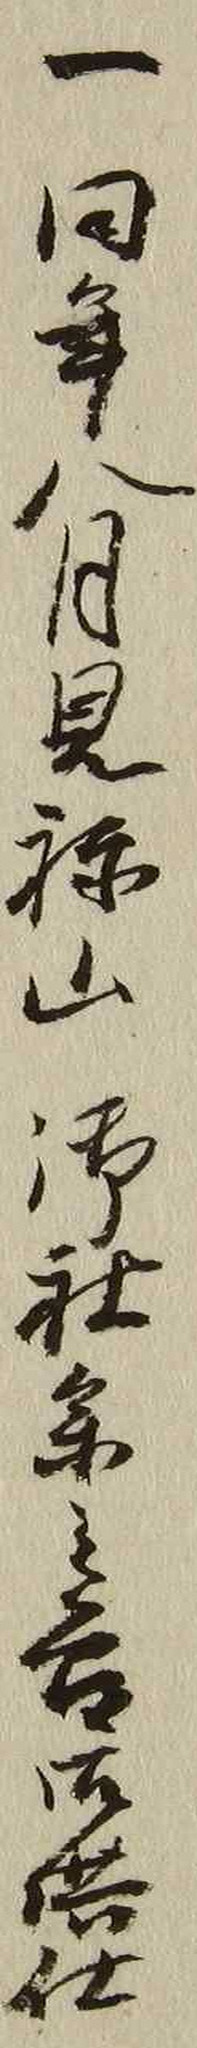一同年八月見禰山御社参之節御供仕
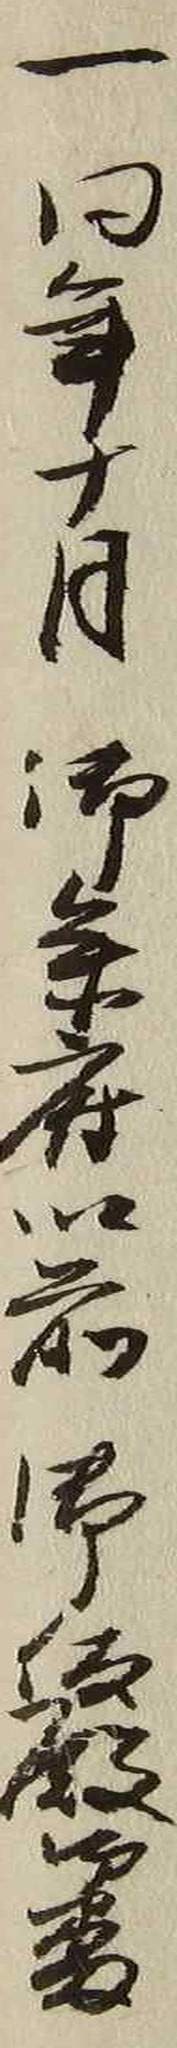一同年十月御参府以前御仮殿御番
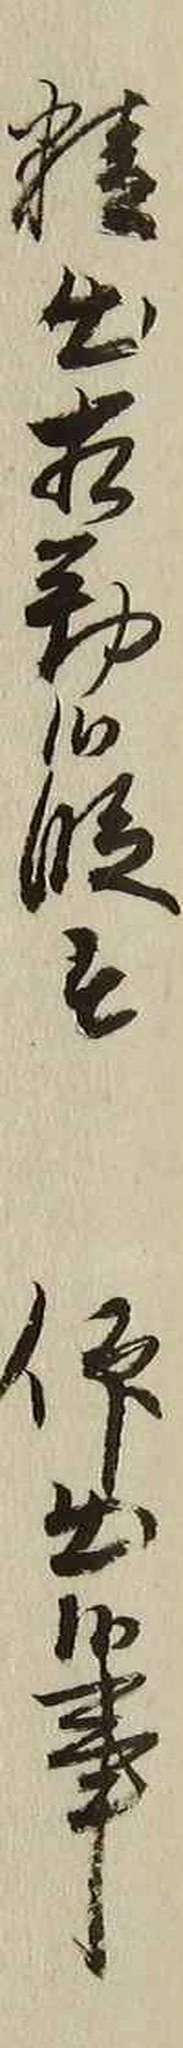精出相勤候段被仰出候事
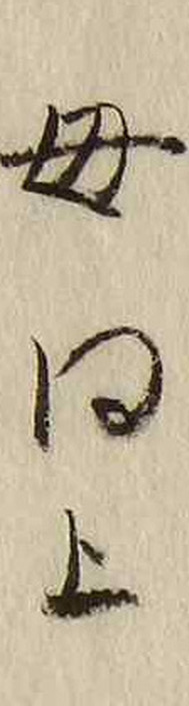母同上

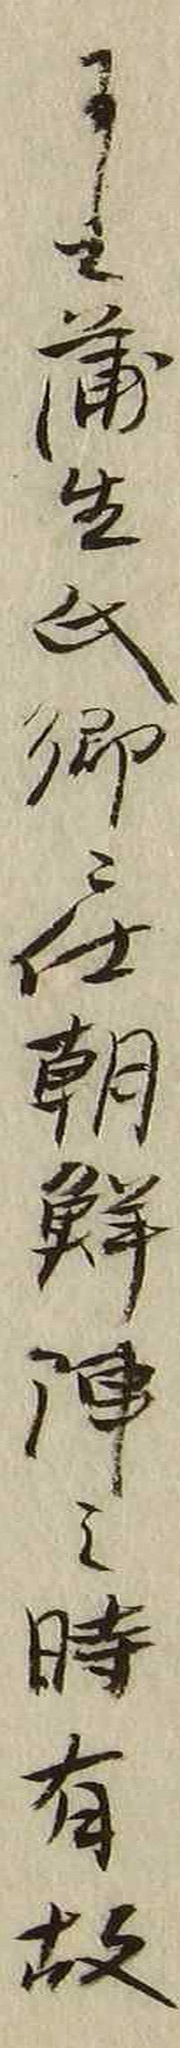にして蒲生氏郷ニ仕朝鮮陣之時有故
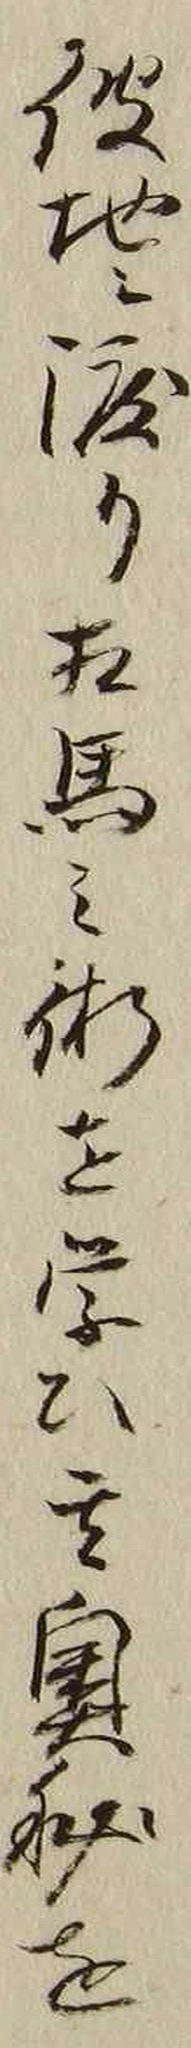彼地ニ渡り相馬之術を学ひ其奥秘を
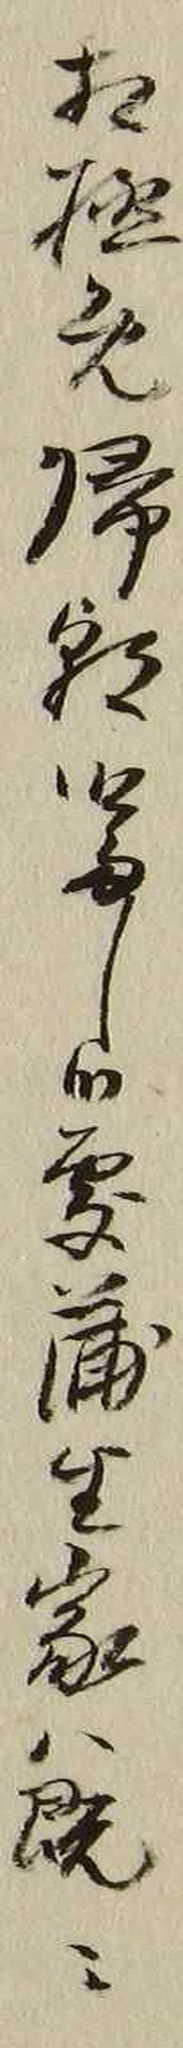相極め帰朝いたし候処蒲生家ハ既ニ
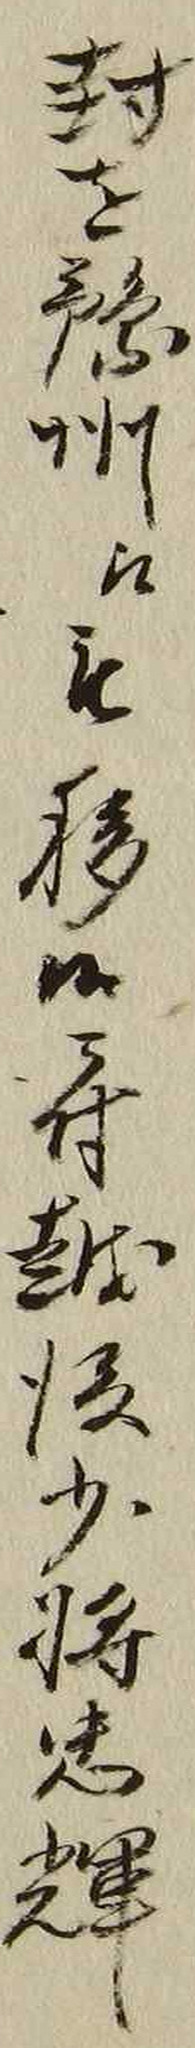封を予州江被移候ニ付越後少将忠輝
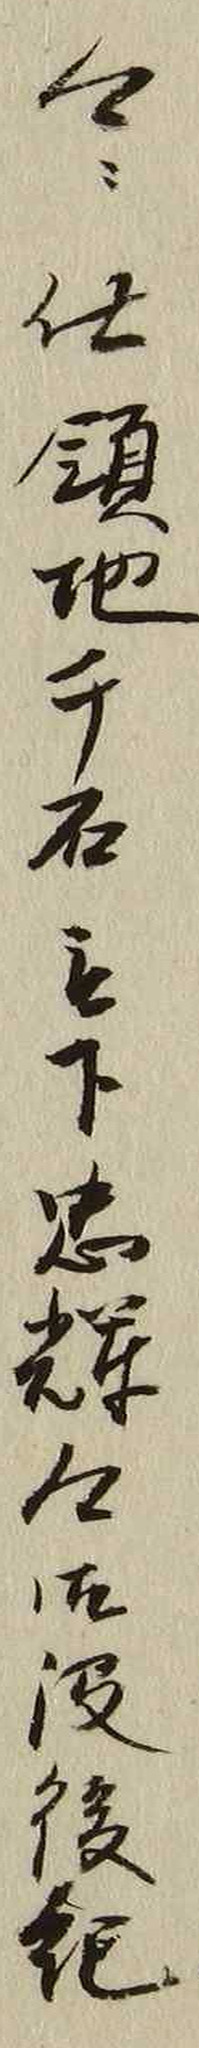卿ニ仕領地千石被下忠輝卿御没後紀
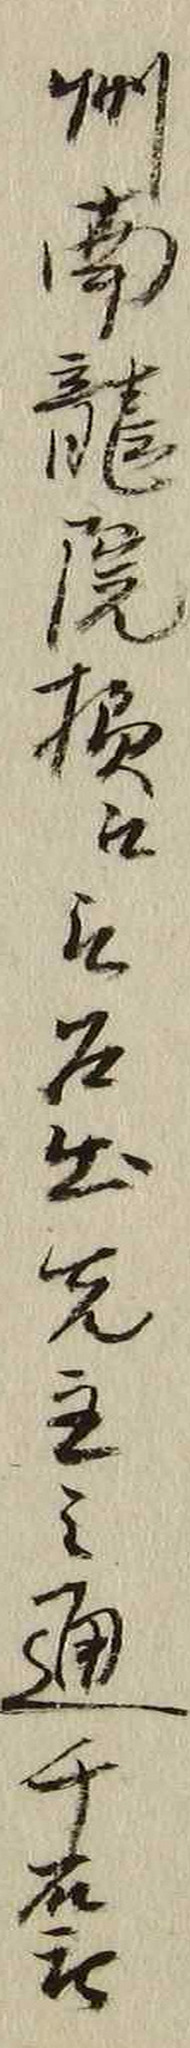州南龍院様江被召出先主之通千石被
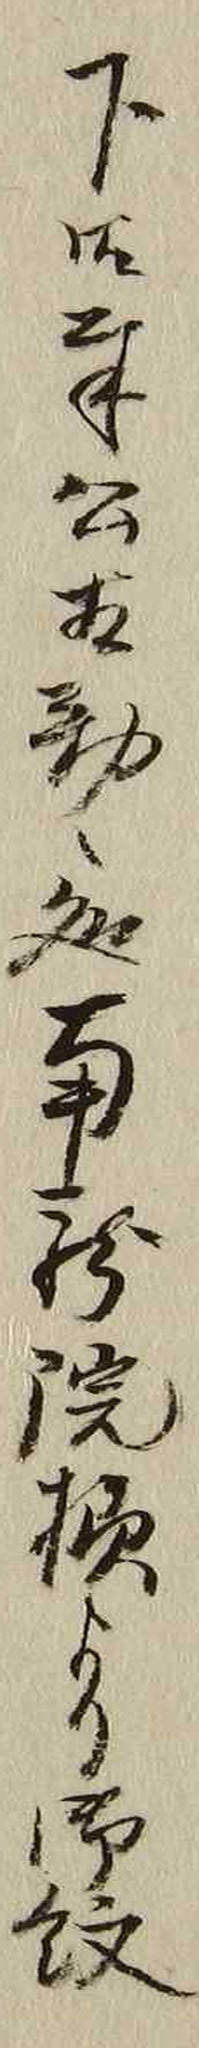下御奉公相勤候処南龍院様より御紋
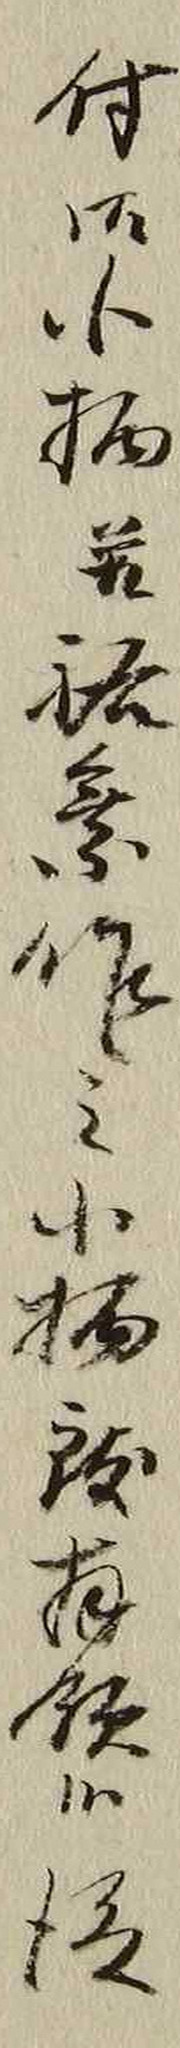付御小柄并祐乗作之小柄致拝領候後
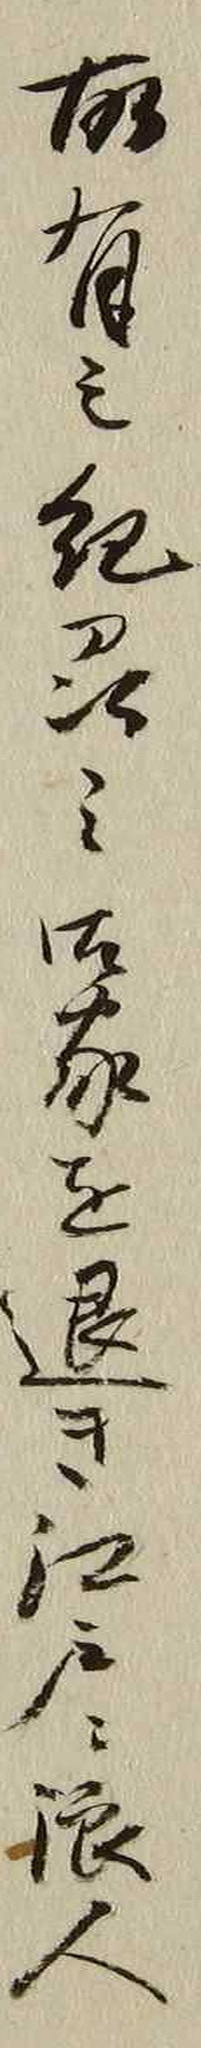故有之紀州之御家を退き江戸ニ浪人
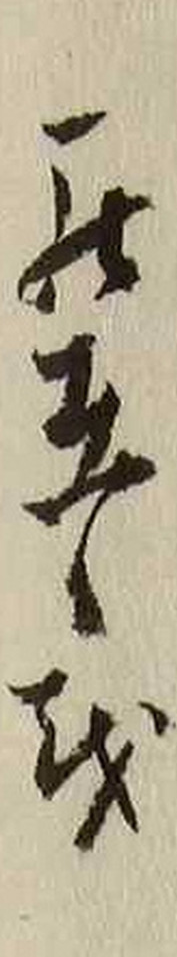罷在候を
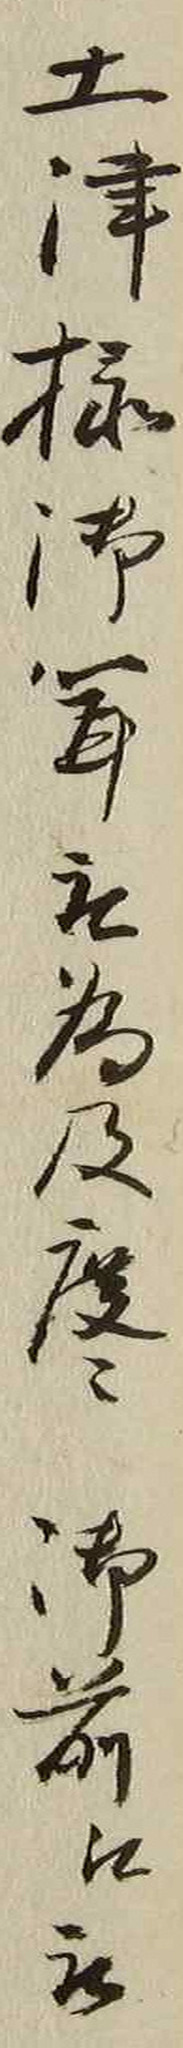土津様御聞被為及度々御前江被
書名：諸士系譜　巻之345　も之部1
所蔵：会津若松市立会津図書館
